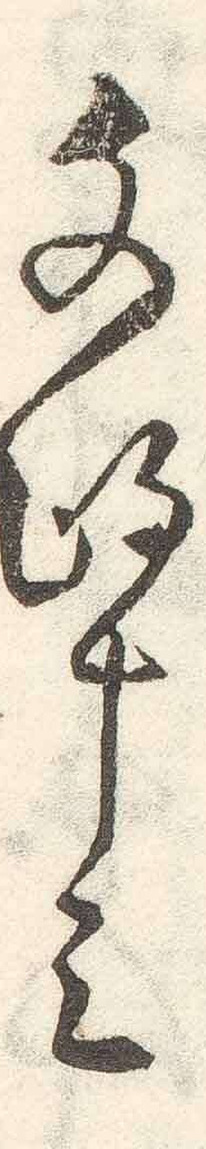文政十三
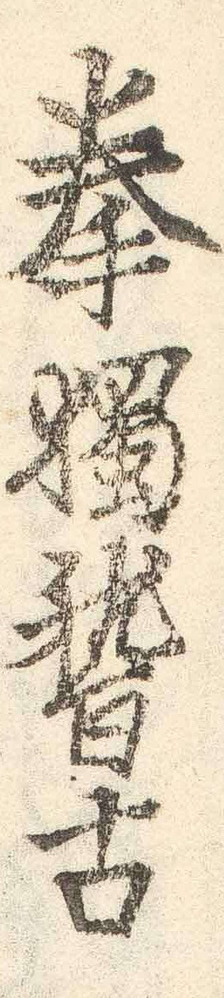拳独稽古

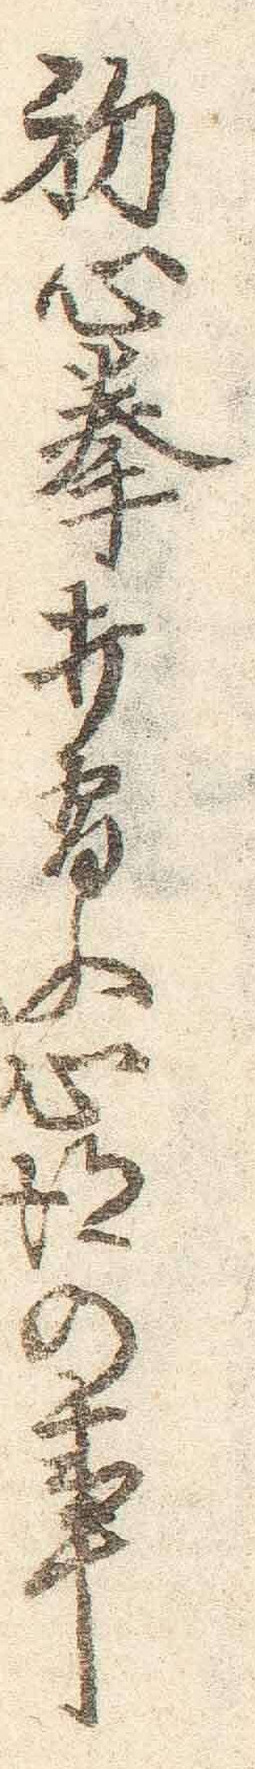初心拳打為に心得の事
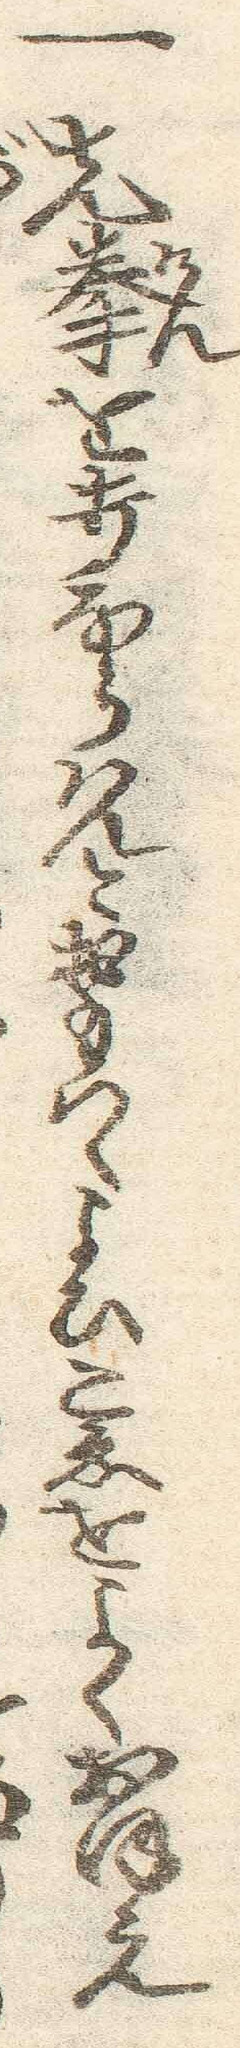一先拳を打ならはんとおもはゝよひこゑをよくおほえ
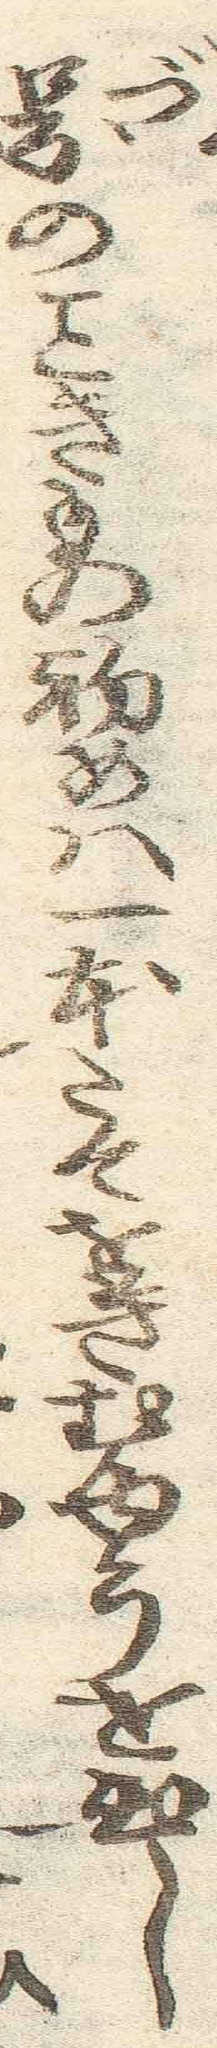図のこときもの初めは一本たてをきむゆうを出し
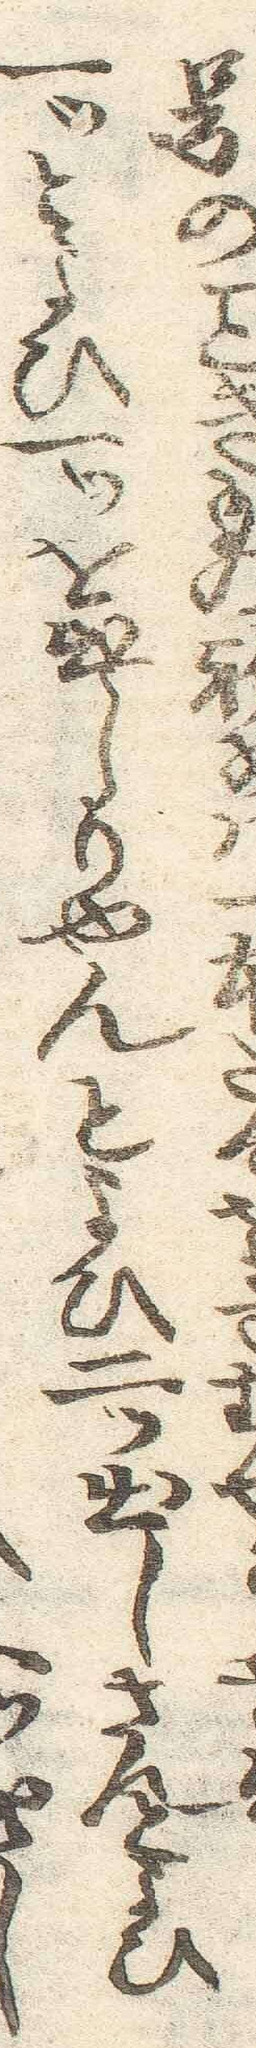一ッとよひ一ッを出しりやんとよひ二ッ出しさんとよひ
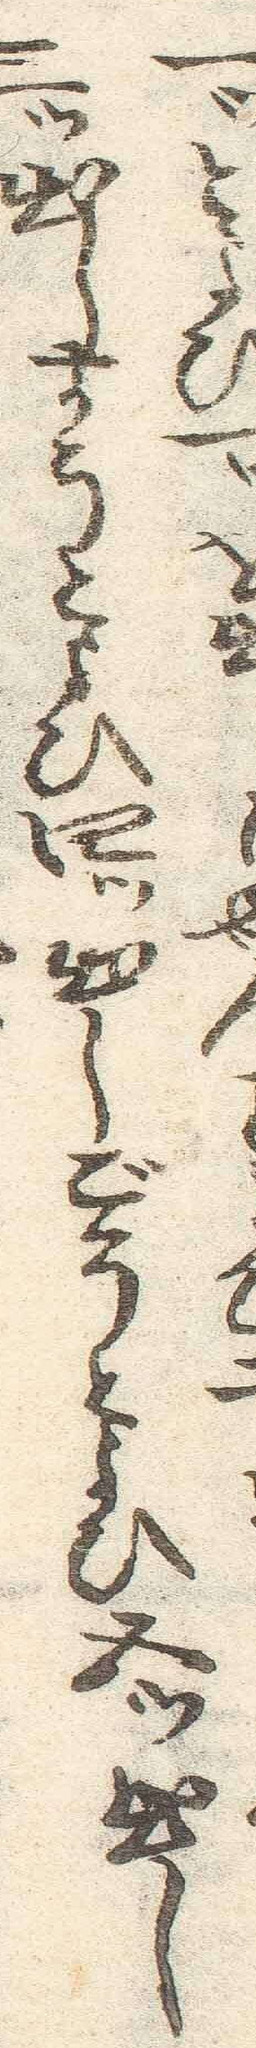三ッ出しすうとよひ四ッ出しごうとよひ五ッ出し
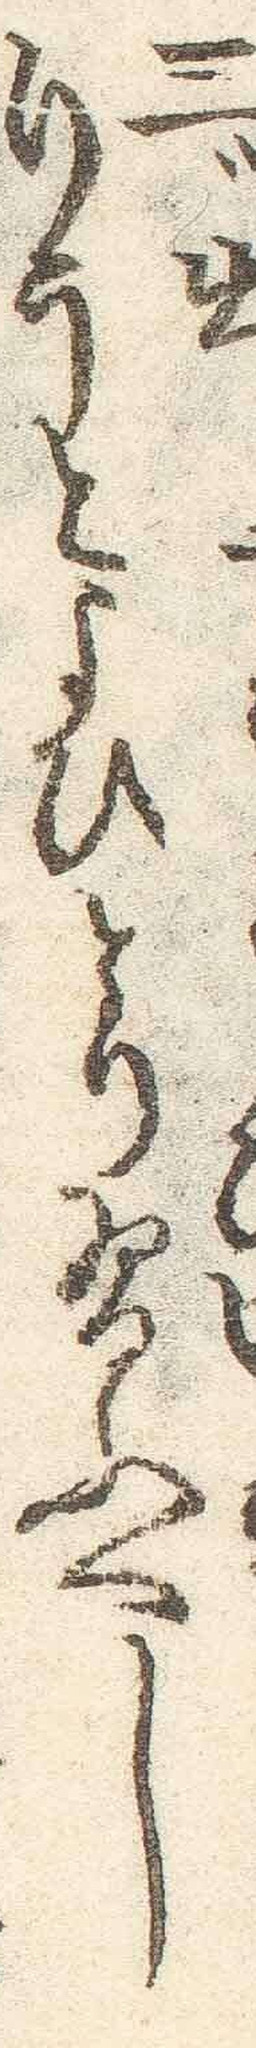りうとよひとり習ふへし
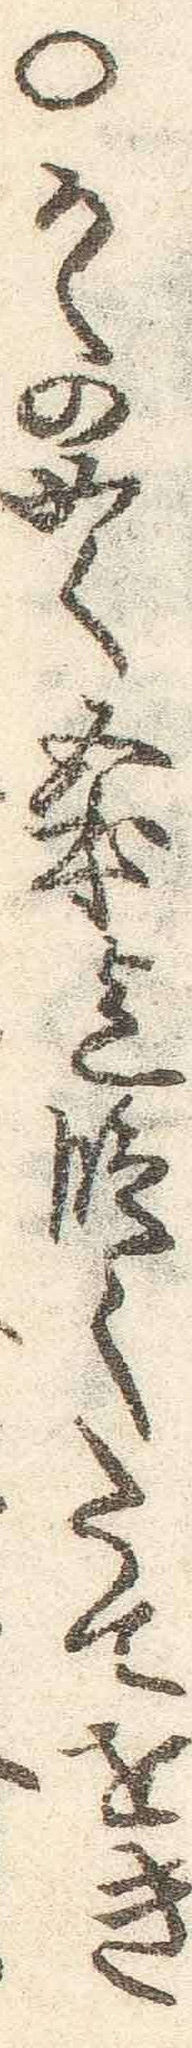〇かくの如く五本迄段々たてをき
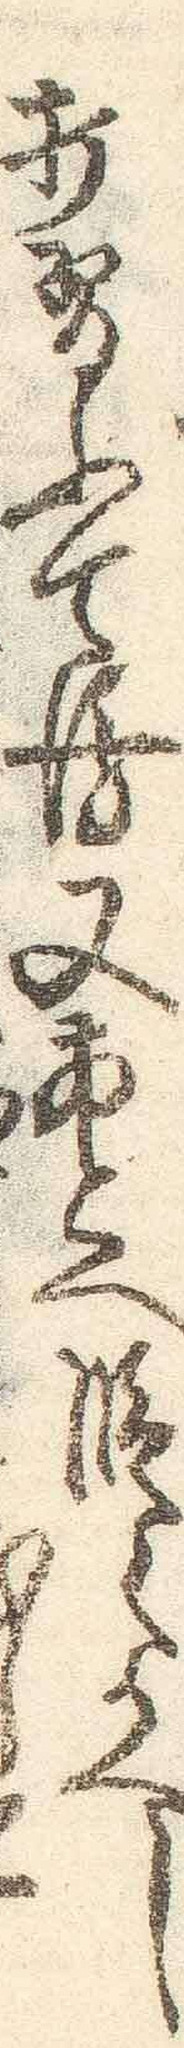打習ふて後又あとへ段々かへし
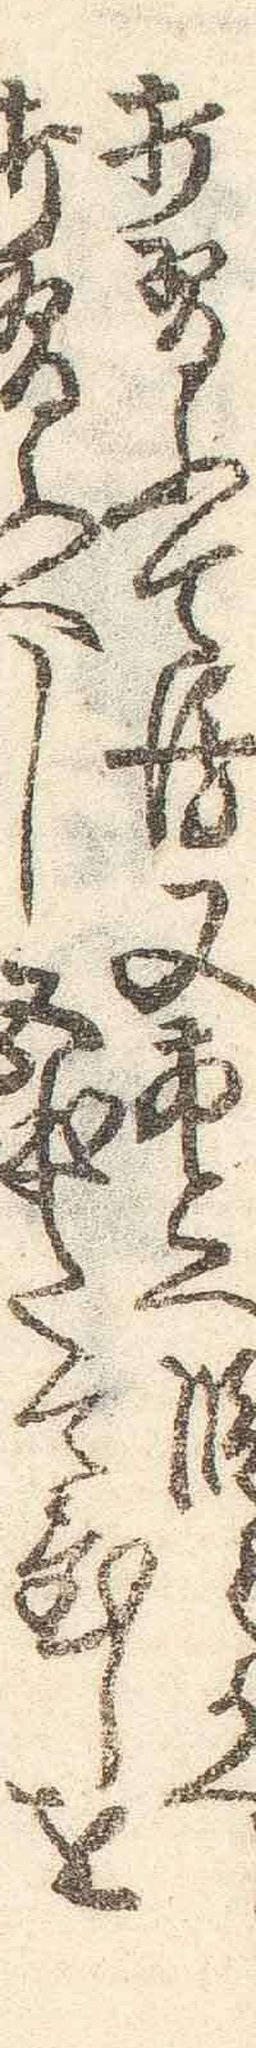打習ふへし五本たて置しを
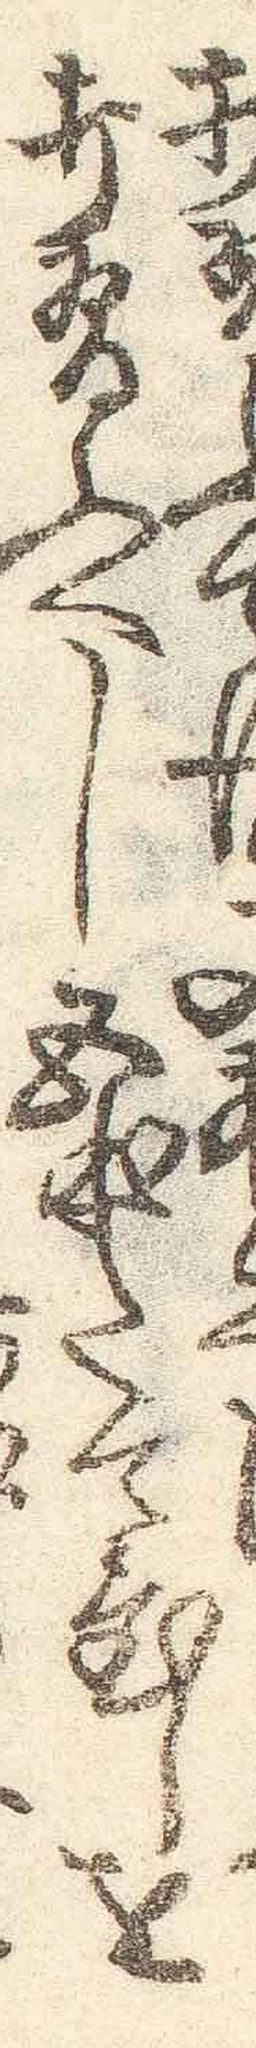打習ふへし五本たて置しを
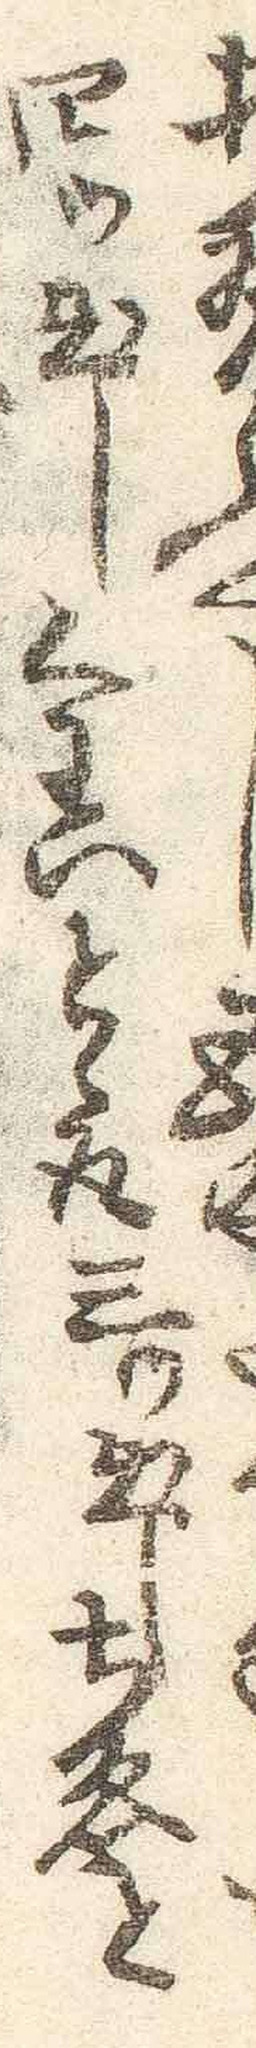四ッ出しくわいと取三ッ出しちゑと
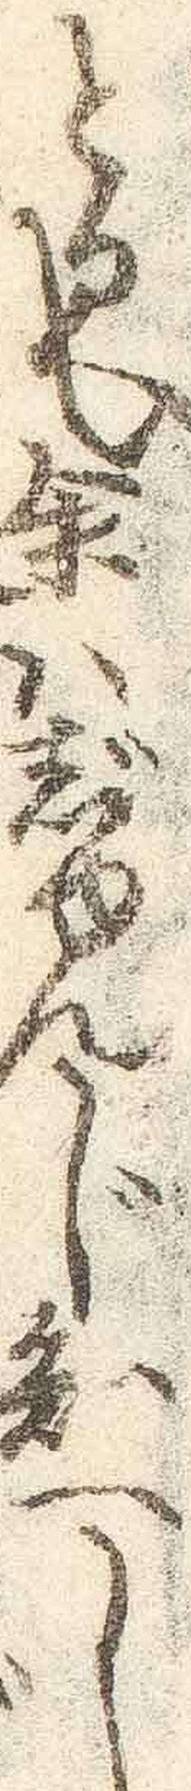とるへし余はじゆんじ知へし
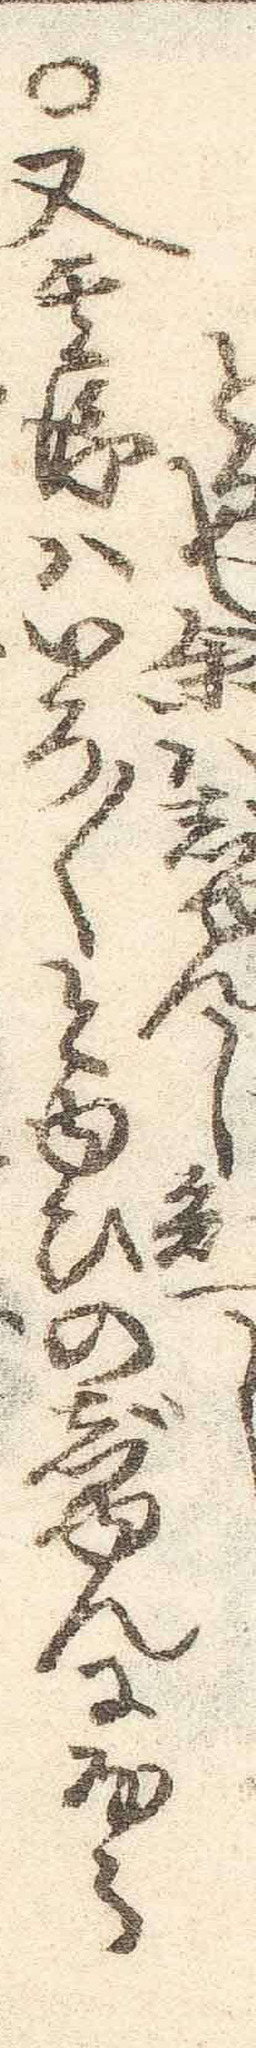〇又其後はいろ〳〵とゆひのじゆんになら
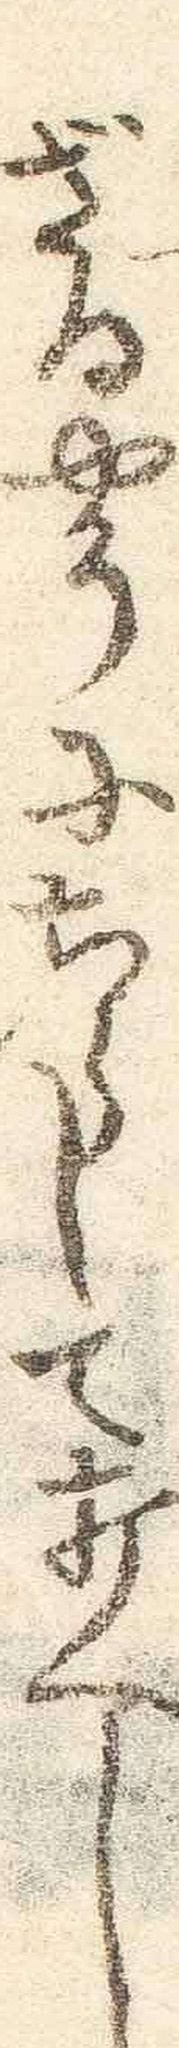ざるやうにちらして打へし
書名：拳独稽古
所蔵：東京学芸大学附属図書館 国文学研究資料館
